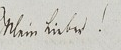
Mein Lieber!
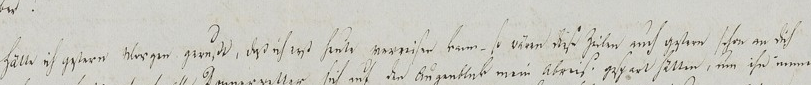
Hätte ich gestern Morgen gewußt, daß ich erst heute verreisen kann, so wären diese Zeilen auch gestern schon an dich
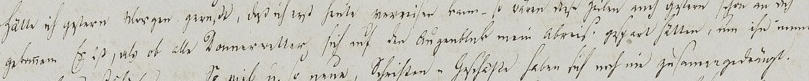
gekommen. Es ist, als ob alle Donnerwetter sich auf den Augenblick meiner Abreise gespart hätten, um ihn immer
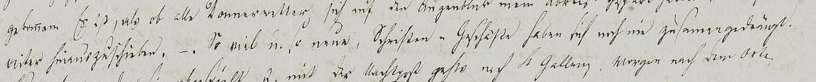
weiter hinauszuschieben. – So viele u. so neue Schriften u Geschäfte haben sich noch nie zusammengedrängt.
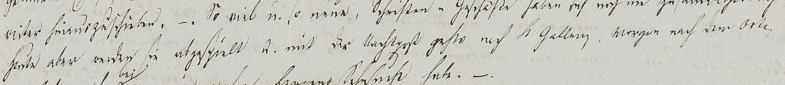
Heute aber werden sie abgespielt u. mit der Nachtpost gehts nach St Gallen morgen nach dem Orte,
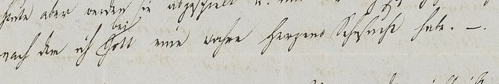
nach dem ich bei Gott eine wahre Herzens Sehnsucht habe. –
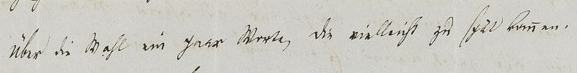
Über die Wahl ein paar Worte, die vielleicht zu spät kommen.
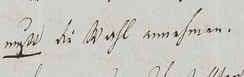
mußt die Wahl annehmen.
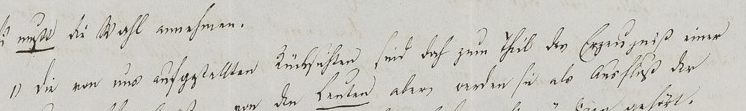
1) Die von uns aufgestellten Rücksichten sind doch zum Theil das Erzeugniß einer
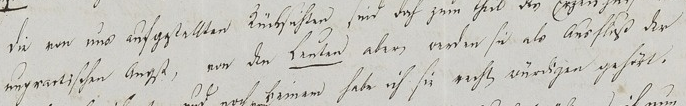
unpractischen Angst, von den Leuten aber werden sie als Ausfluß der
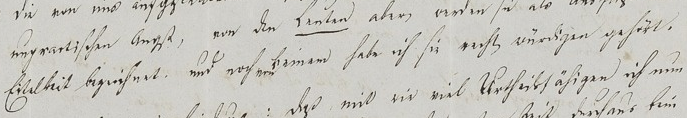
Eitelkeit bezeichnet und noch von keinem habe ich sie recht würdigen gehört.
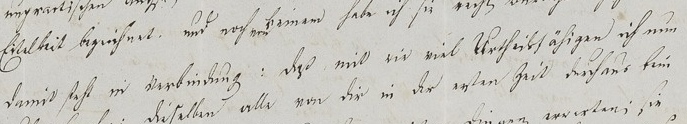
Damit steht in Verbindung: daß mit wie vielen Urtheilsfähigen ich nun
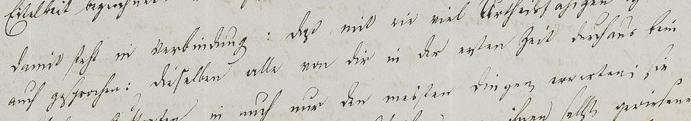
auch gesprochen: dieselben von dir in der ersten Zeit durchaus kein
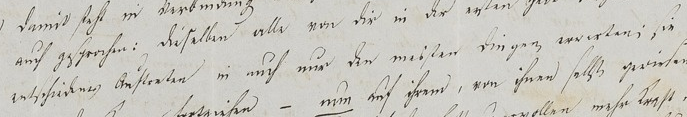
entschiedenes Auftreten in auch nur den meisten Dingen erwarten; sie
